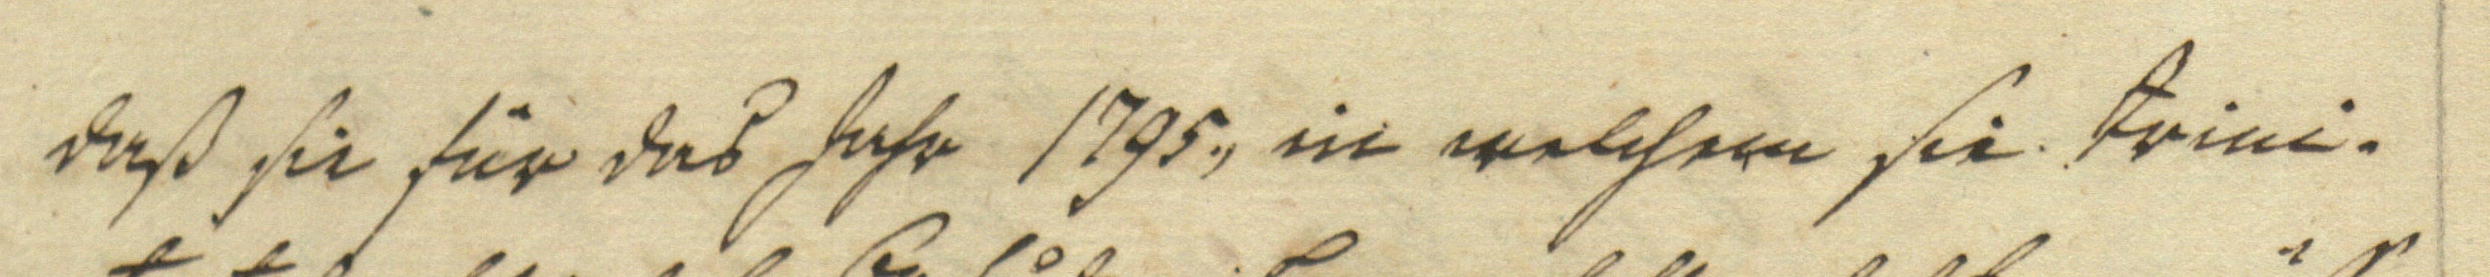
daß sie für das sehr 1795., in welchem sie Trini¬
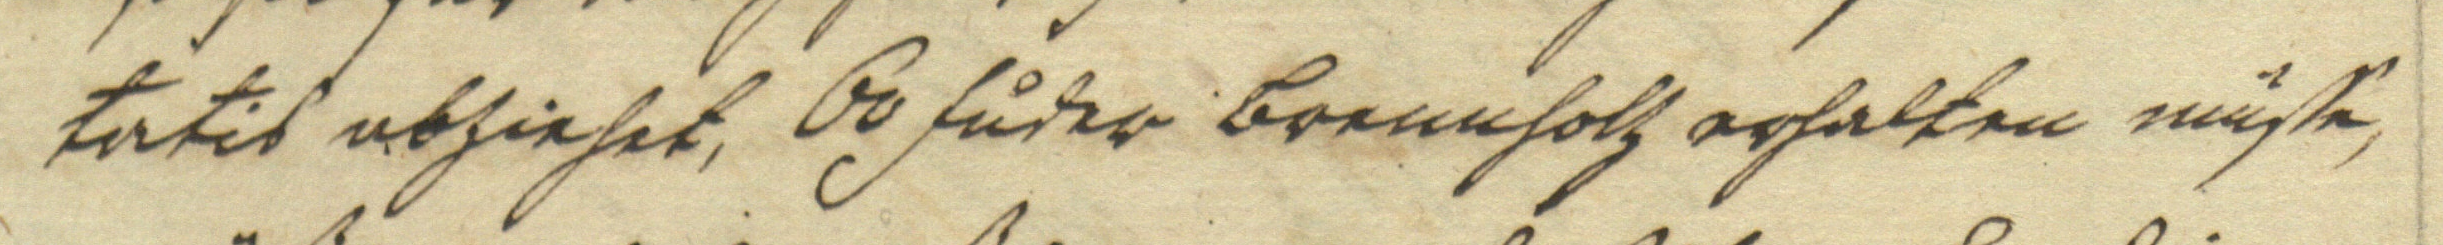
tatis abziehet, 60 Fuder Brennhotz erhalten müsse,
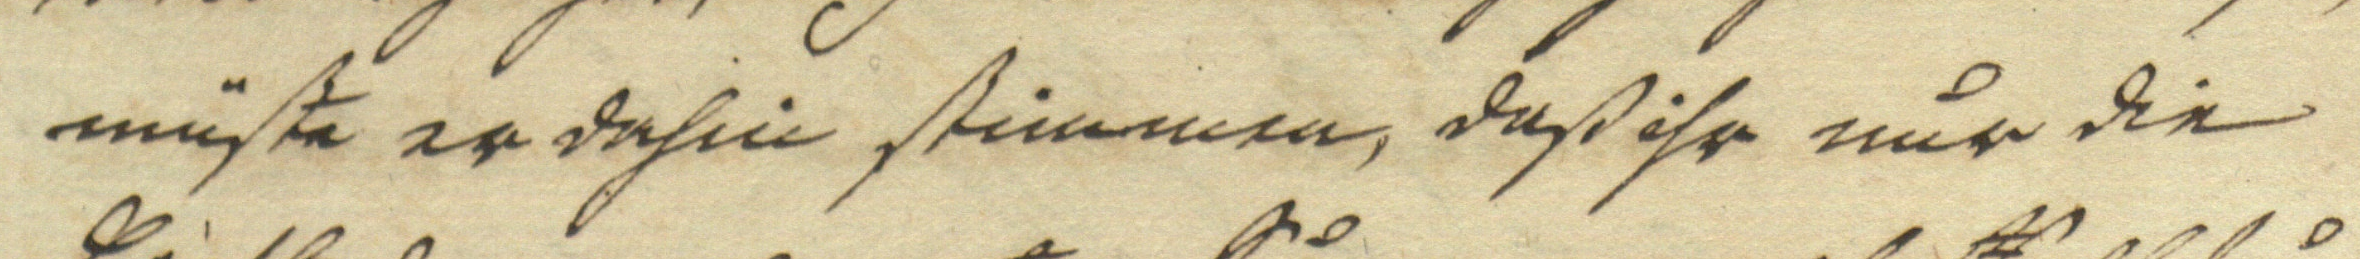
müßte er dahin stimmen, daß ihr nur die
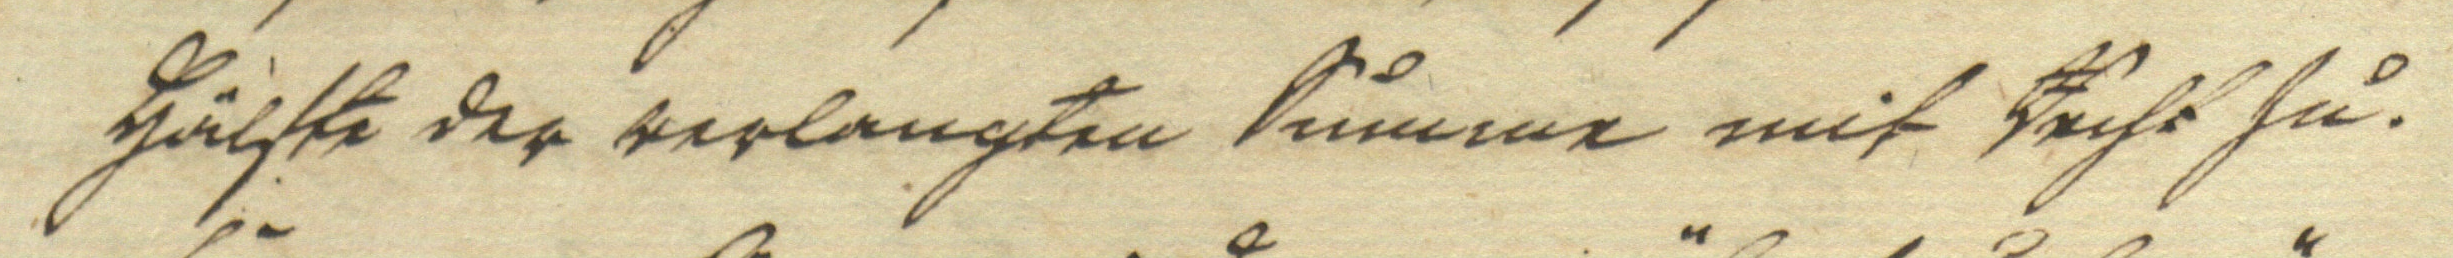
Hälfte der verlangten Summe mit Recht zu¬
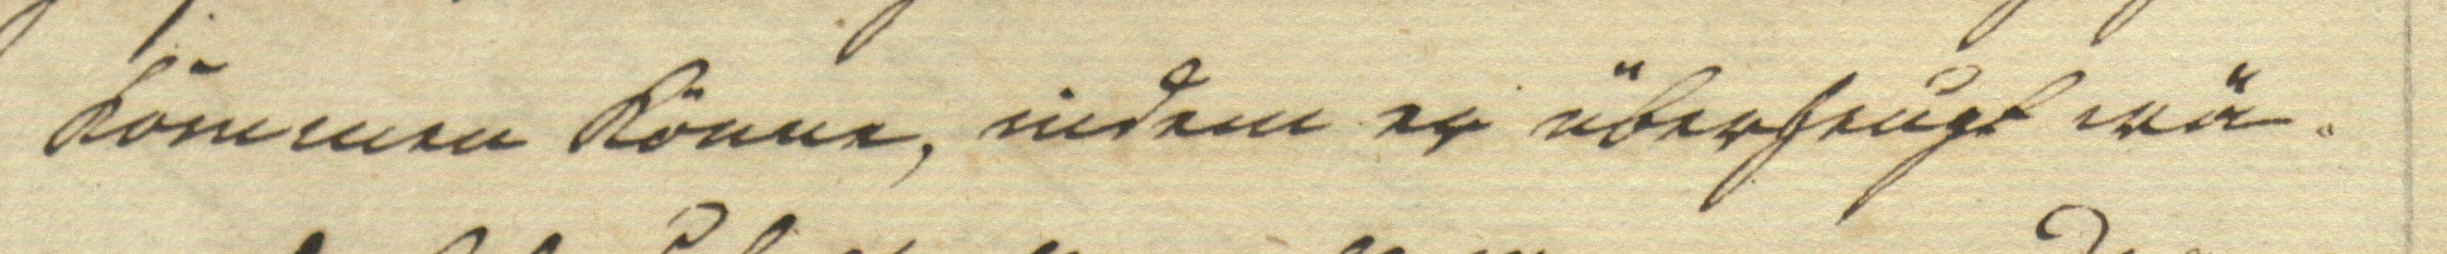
kommen könne, indem er übergeugt wä¬
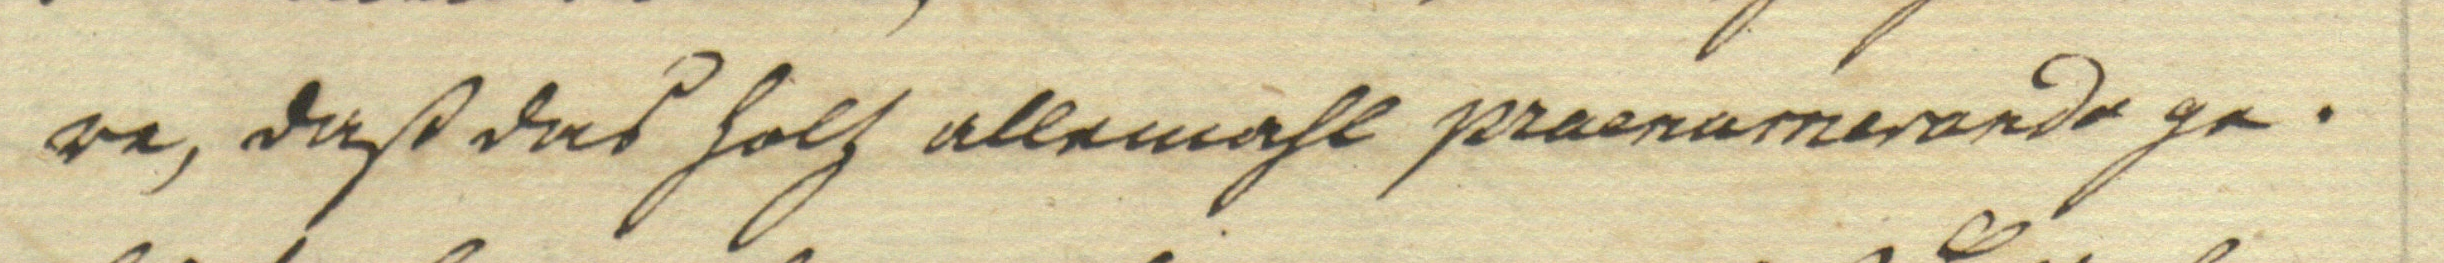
re, daß das Holz allemahl praenumerando ge¬
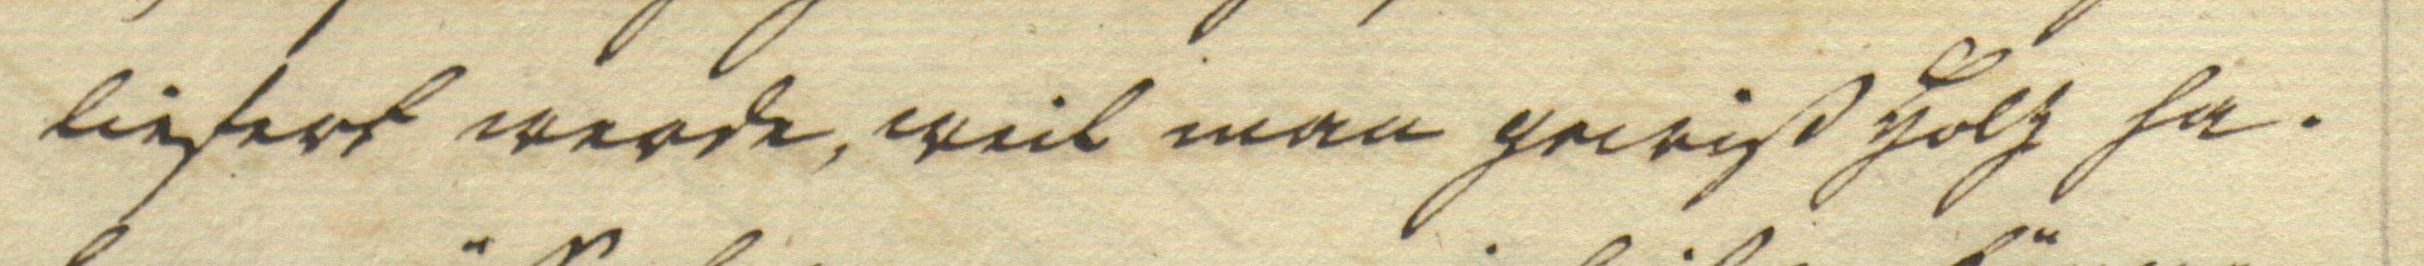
liefert werde, weil man gewiß Holz ha¬
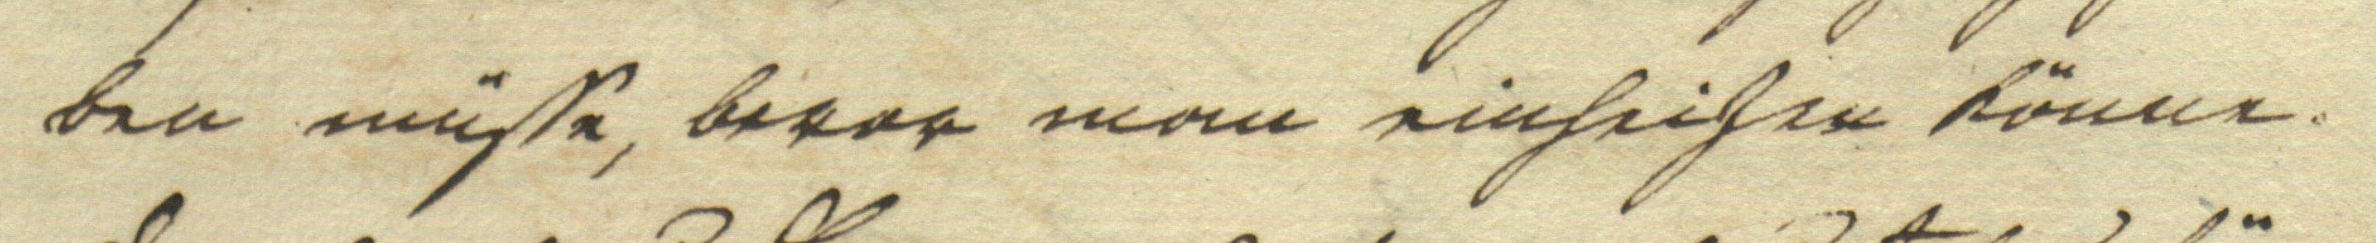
ben müsse, bevor man einheizen könne.
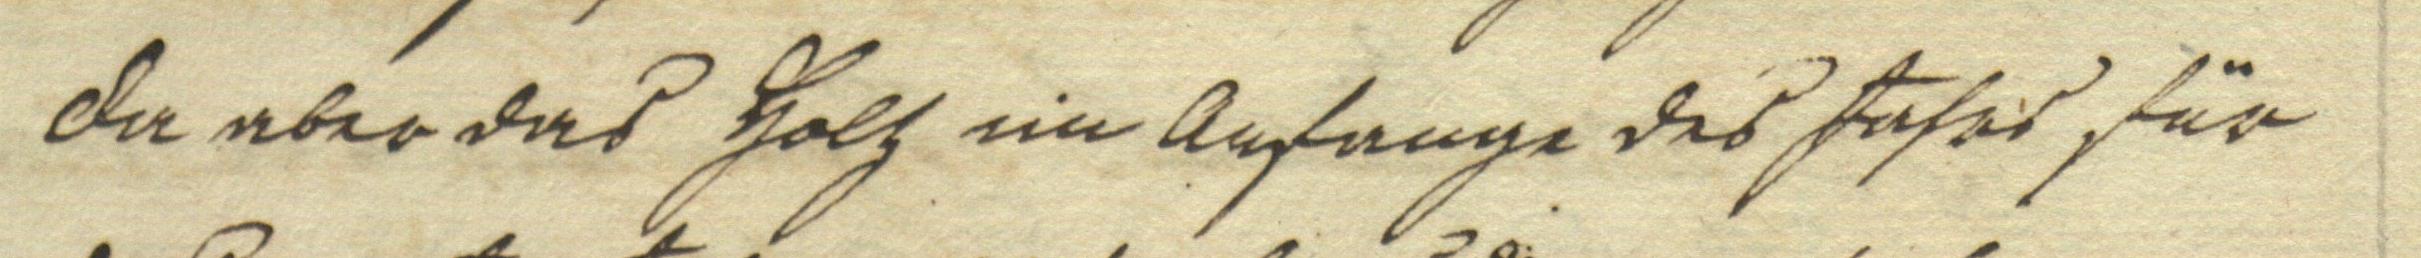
Da aber das Holz im Anfange des Jahrs für
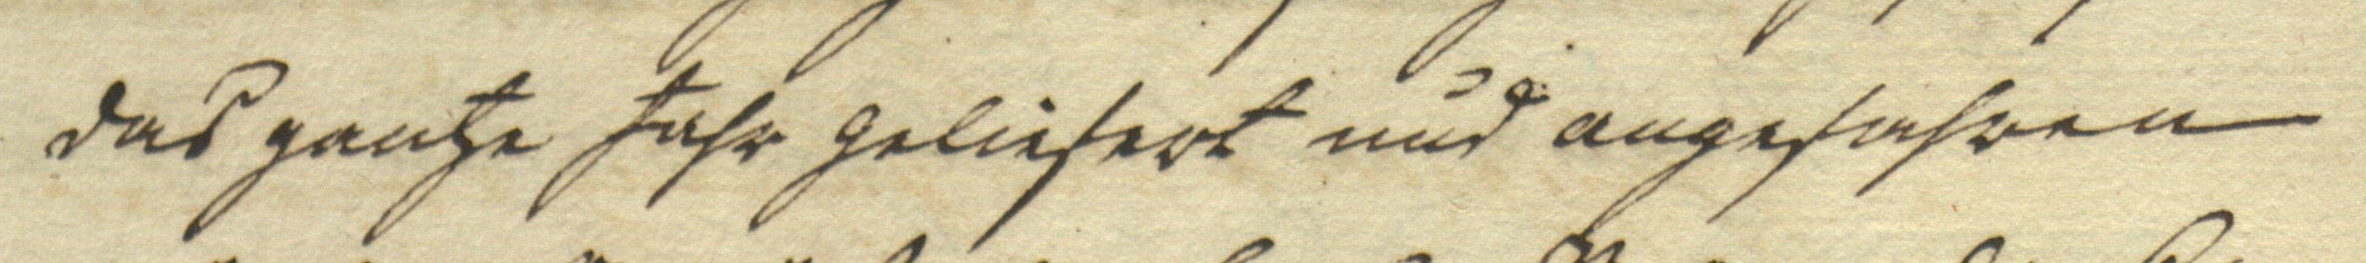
das gantze Jahr geliefert und angefahren
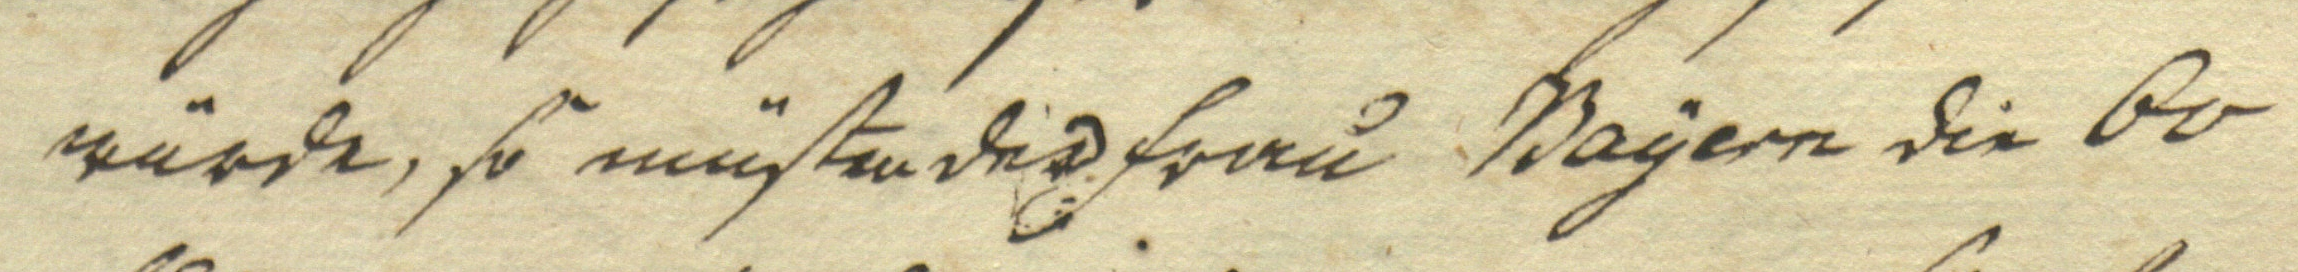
würde, so müßten der Frau Baÿern die 60
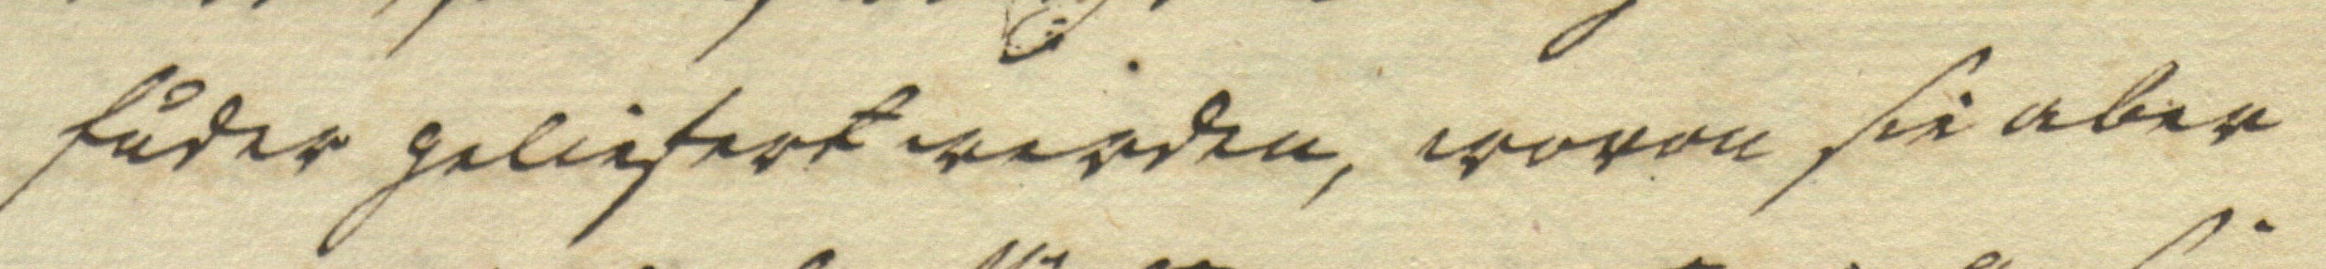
Fuder geliefert werden, wovon sie aber
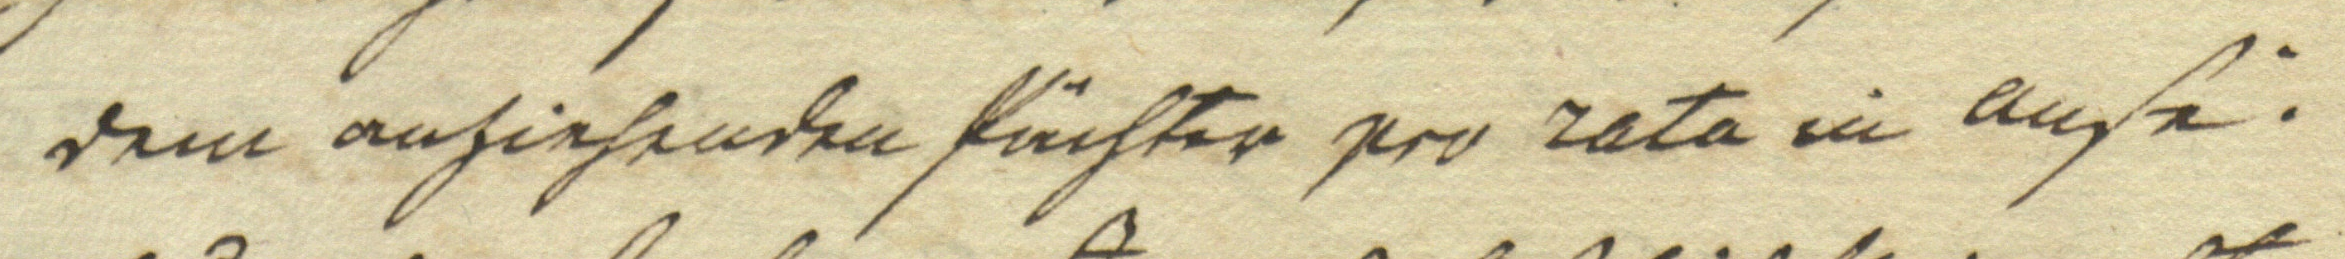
dem anziehenden Pächter pro rata in Anse¬
